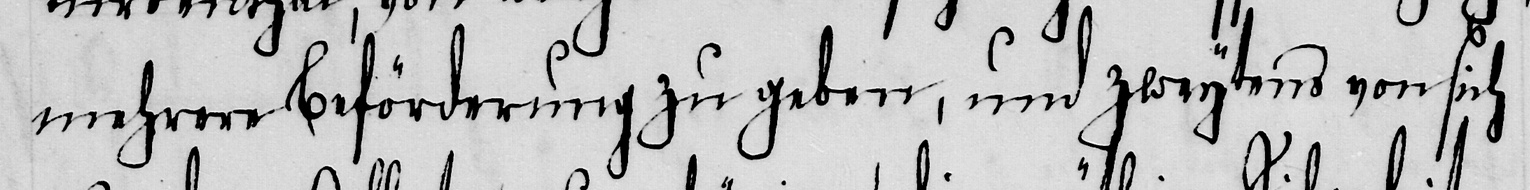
mehrere Beförderung zu geben, und zweytens von sich
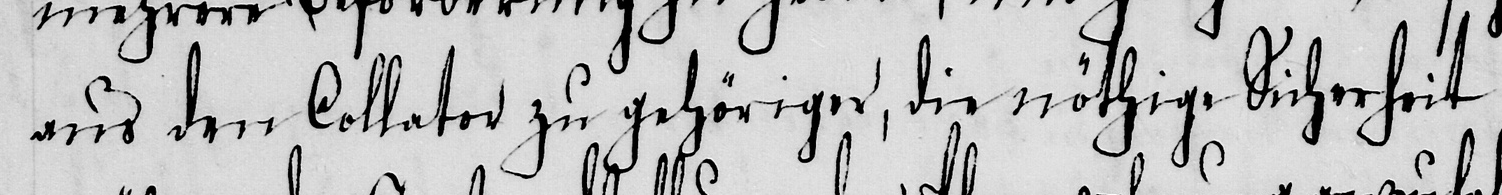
aus den Collator zu gehöriger, die nöthige Sicherheit
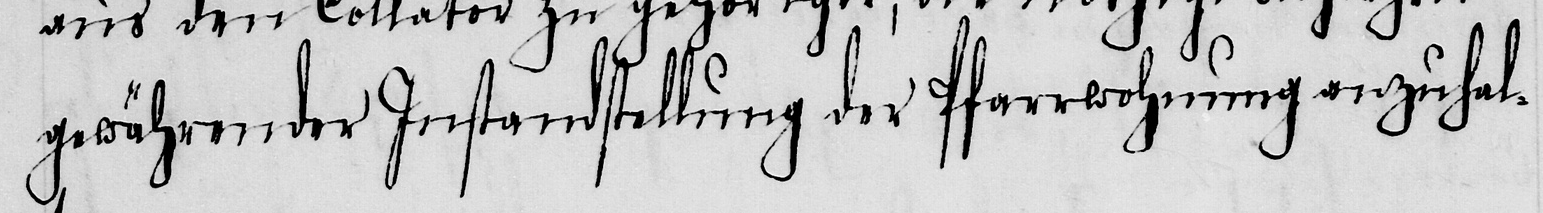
gewährender Instandstellung der Pfarrwohnung anzuhal¬
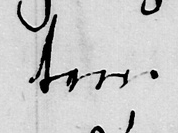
ten
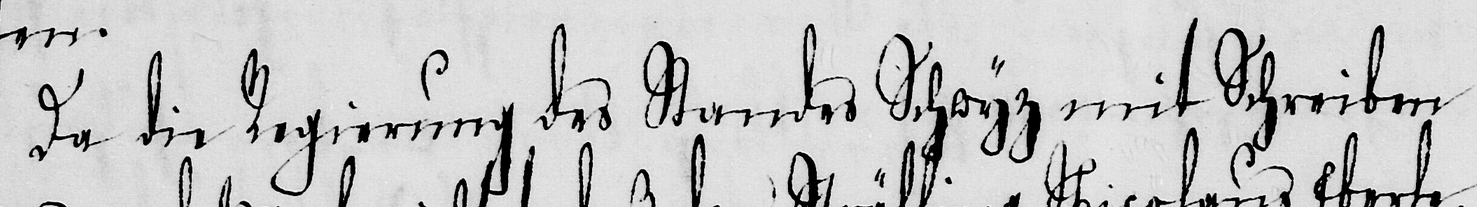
Da die Regierung des Standes Schwyz mit Schreiben
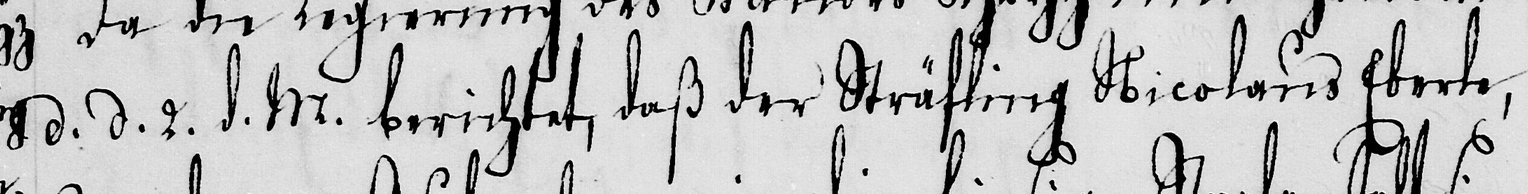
d. d. 2. d. M. berichtet, daß der Sträfling Nicolaus Eberle,
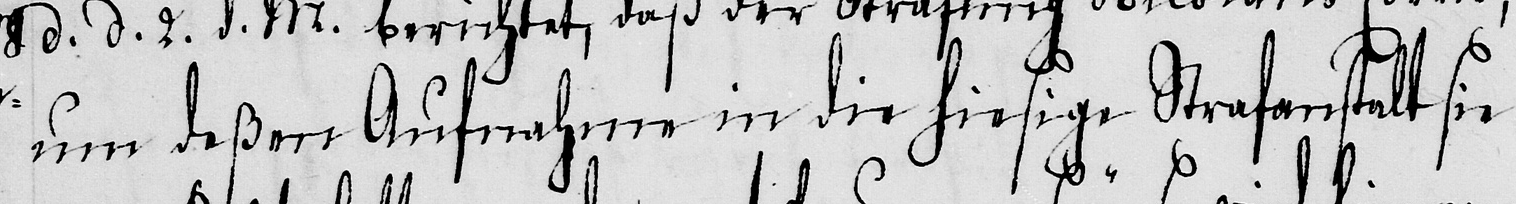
um deßen Aufnahme in die hiesige Strafanstalt sie
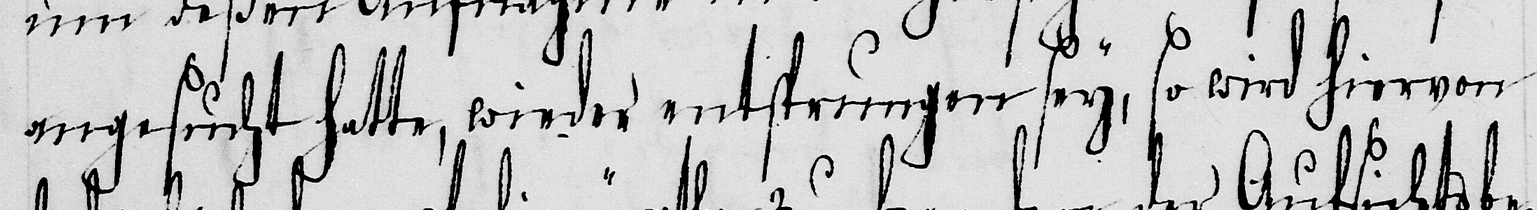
angesucht hatte, wieder entsprungen sey, so wird hiervon
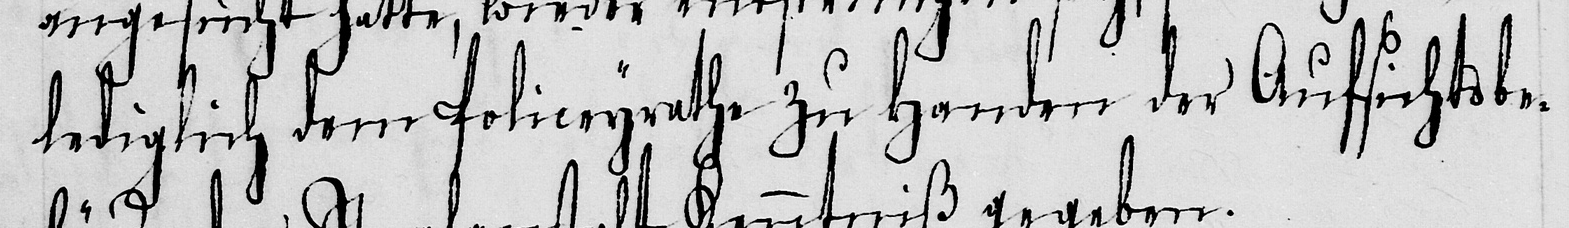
lediglich dem Policeyrathe zu Handen der Aufsichtsbe¬
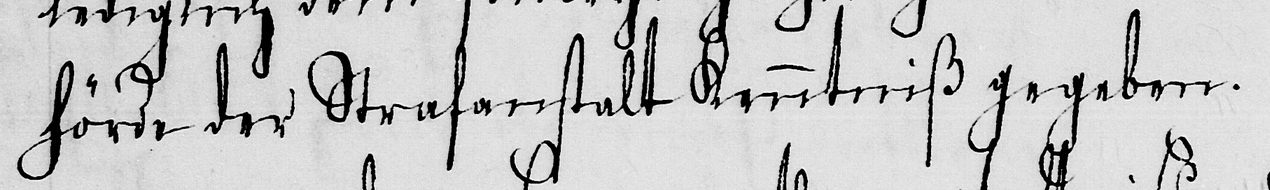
hörde der Strafanstalt Kenntniß gegeben.
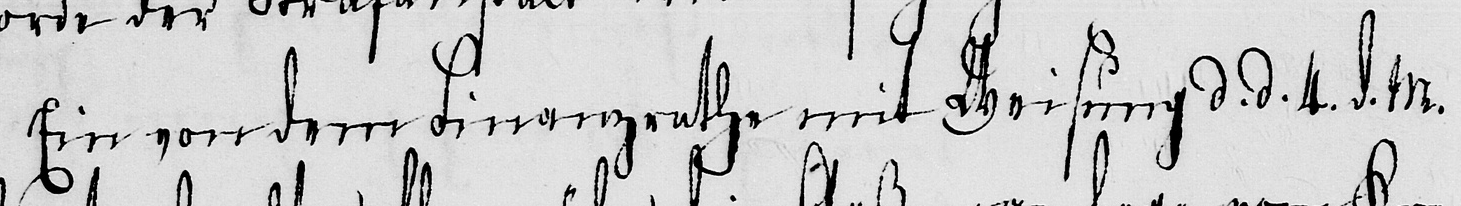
Ein von dem Finanzrathe mit Weisung d. d. 4. d. M.
